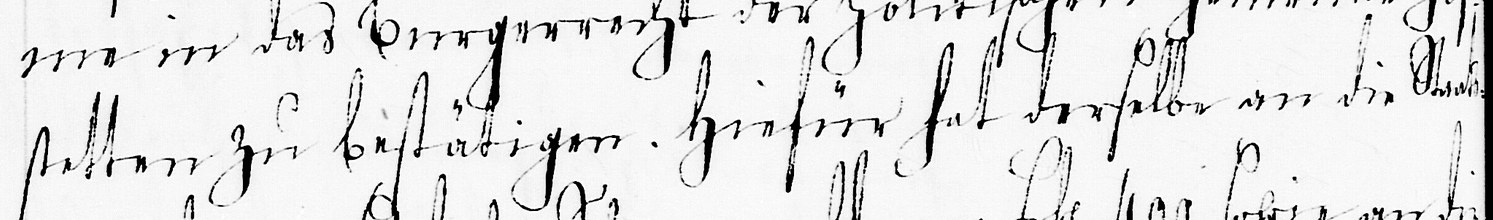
stetten zu bestätigen. Hiefür hat derselbe an die Sta¬
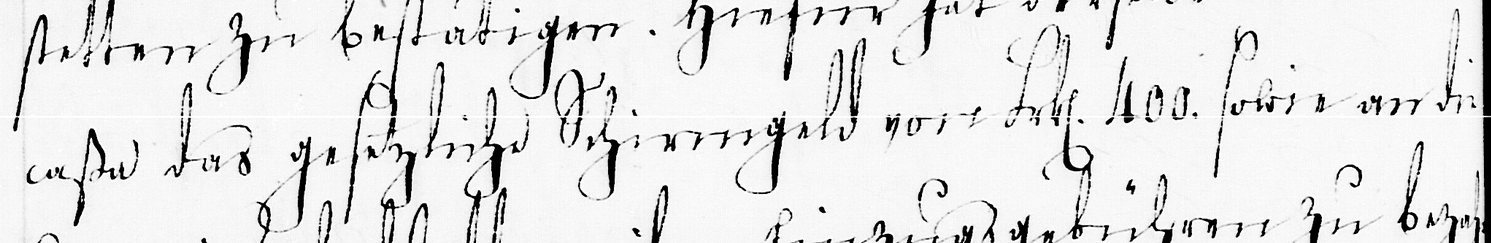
caßa das gesetzliche Schirmgeld von Frk[en]. 400. sowie an die
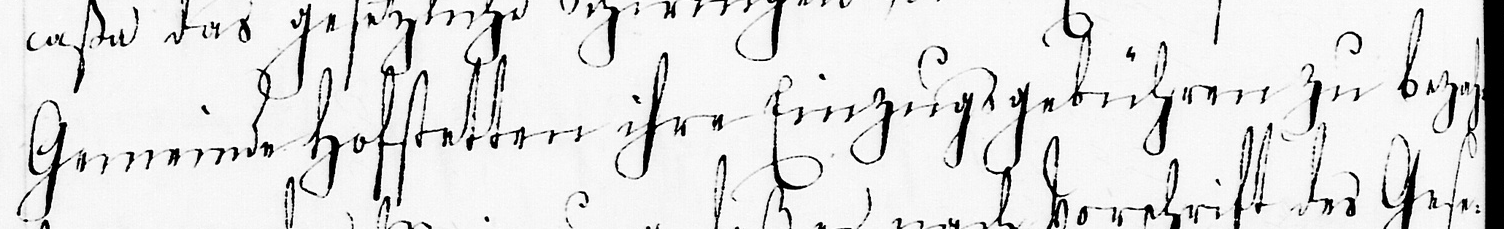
Gemeinde Hofstetten ihre Einzugsgebühren zu beza¬
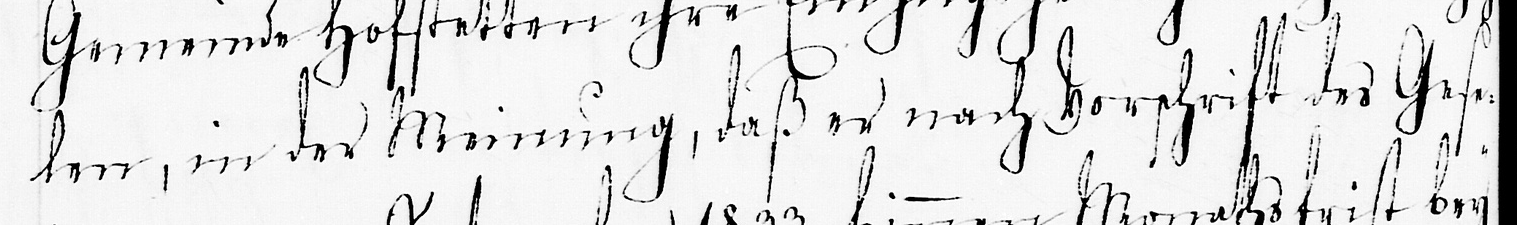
hlen, in der Meinung, daß er nach Vorschrift des Gese¬
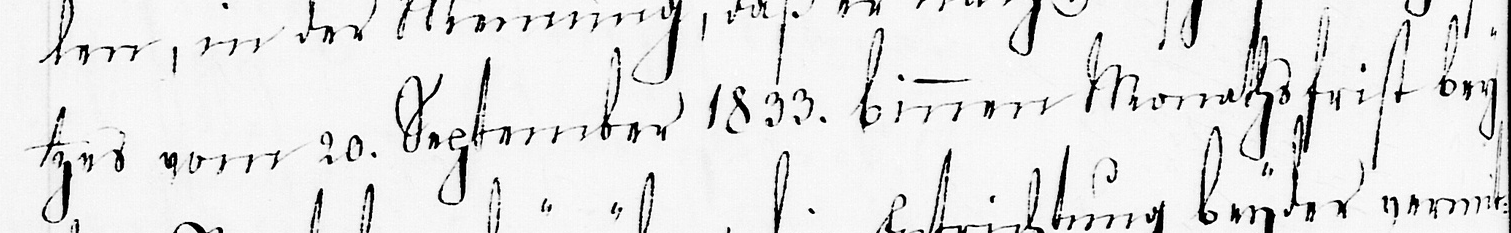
tzes vom 20. September 1833. binnen Monathsfrist bey
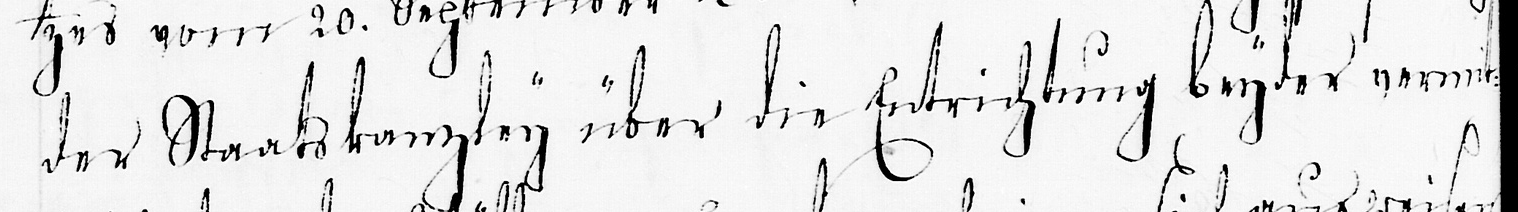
der Staatskanzley über die Entrichtung beyder vermit¬
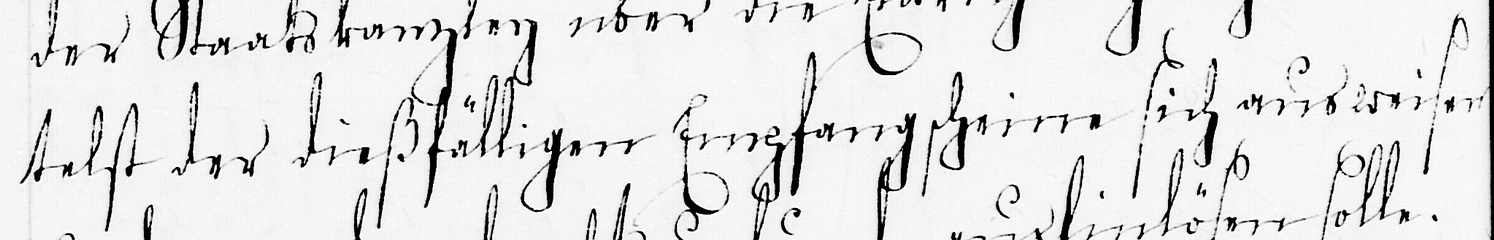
telst der dießfälligen Empfangscheine sich ausweisen
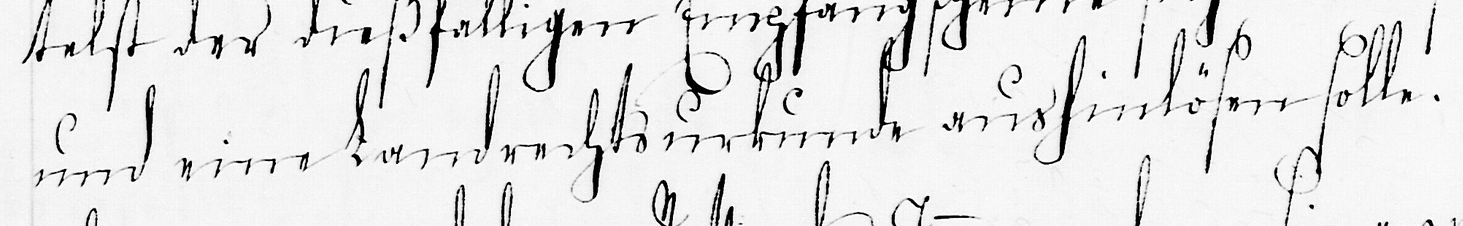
und eine Landrechtsurkunde aushinlösen solle.
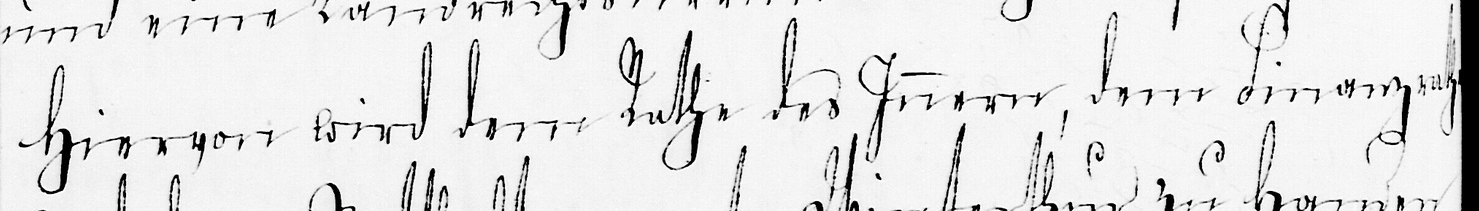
Hiervon wird dem Rathe des Innern, dem Finanzra¬
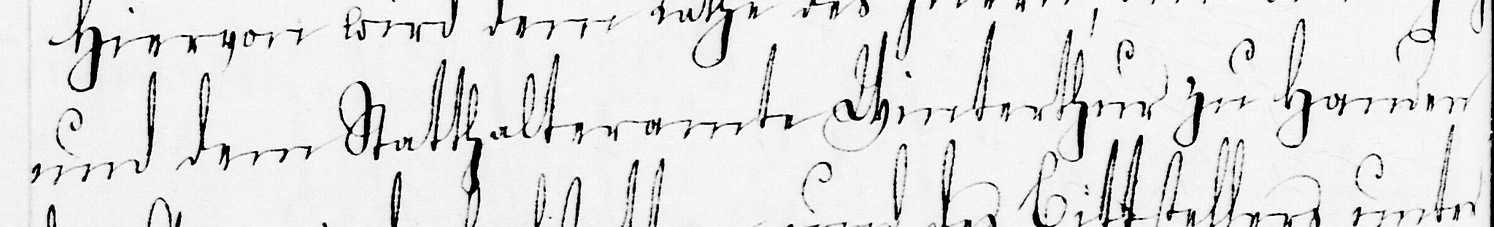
und dem Statthalteramte Winterthur zu Handen
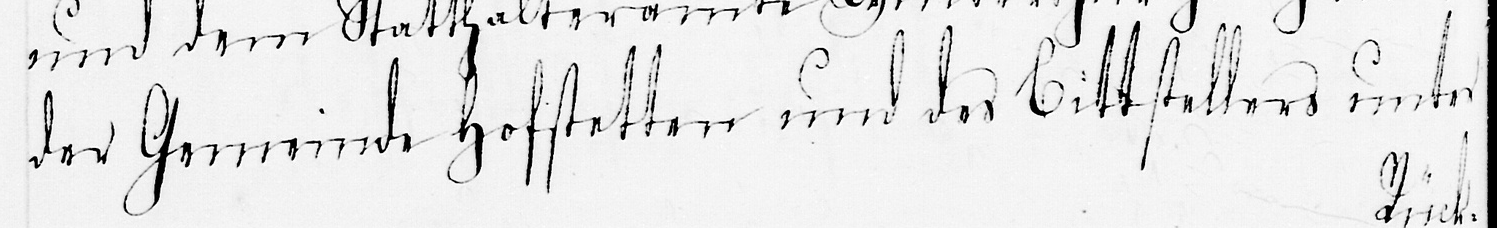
der Gemeinde Hofstetten und des Bittstellers unter
